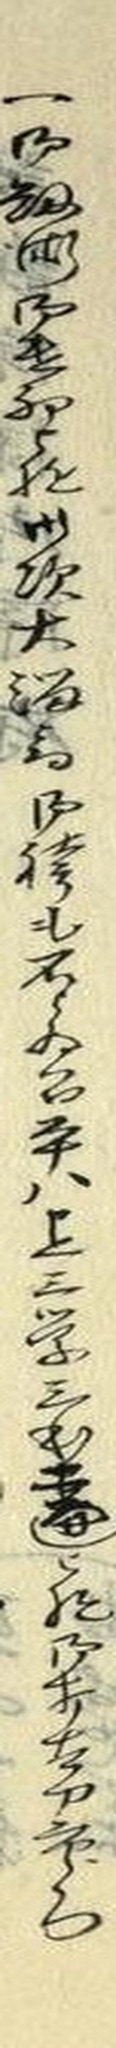一御剣術御遣初被遊御次大溜ニ而御袴も不被為召平八申上三学三本二遍被遊御打太刀市郎右衛門
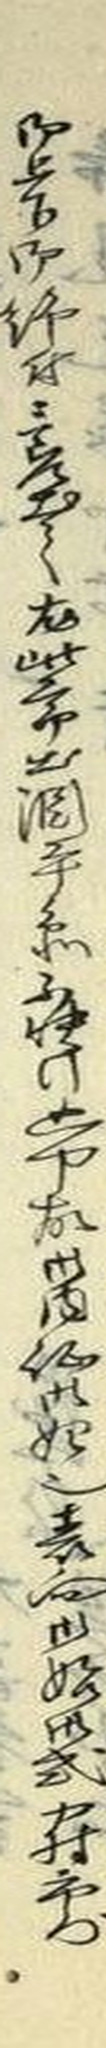御上下御飾付ニ差出之尤此節出淵平兵衛不快引込中故御内証御始也表向御始御式中村市右衛門
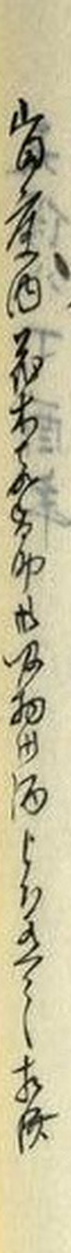山田藤内花木馨助御吸物御酒被下有之相済
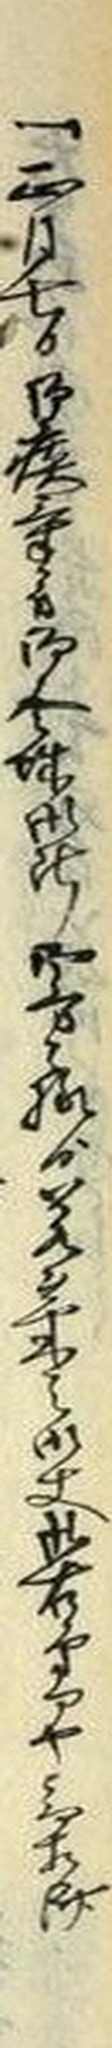一正月七日御疾気ニ付御登城御断御方々様ゟ若菜之御使御右筆部屋ニ而相済
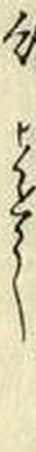被進之
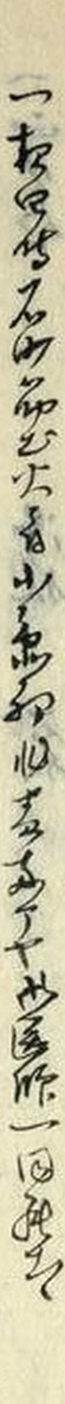一夜四時石町筋出火ニ付小兵衛初非番両部屋御医師一同罷出候
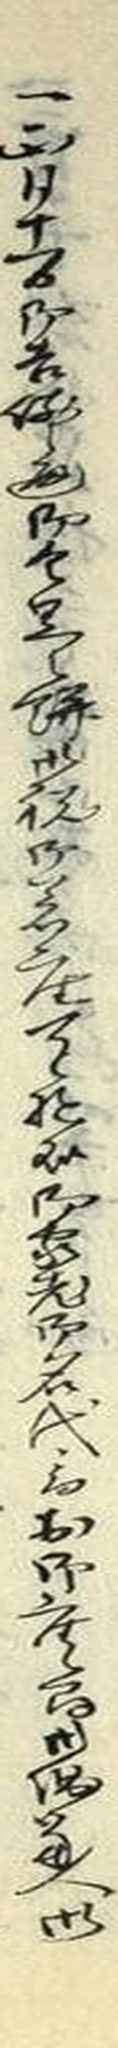一正月十一日御吉例之通御具足之餅御祝御着座可被遊候処御家老御名代ニ而於御座之間御側御用人御
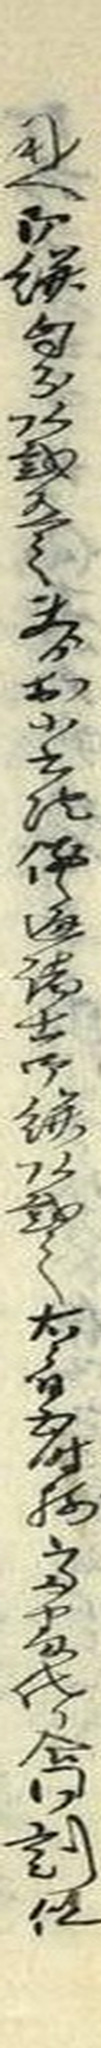用人御餅自分頂戴有之夫ゟ於小書院例之通諸士御餅頂戴之右ニ付五時揃当番代り合同刻但
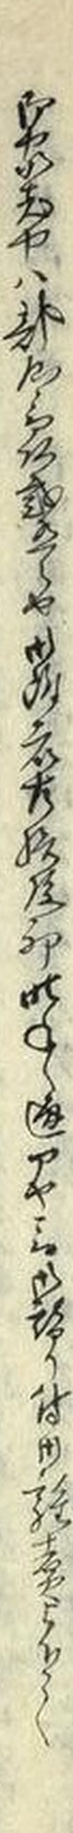御家老中ハ部屋ニ而頂戴有之由御附衆左膳殿初昨年之通部屋ニ而御替り付御雑煮被下之
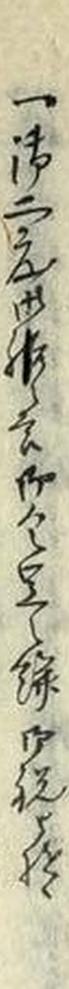一御二度御膳之節御具足之餅御祝被遊候
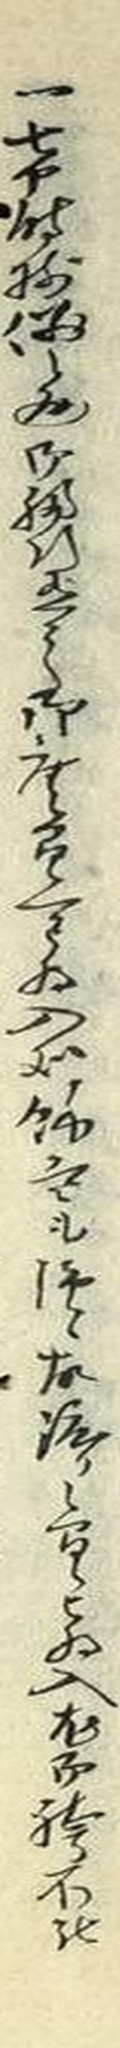一七半時揃例之通御福引有之御座之間へ可被為入処余寒も強候故渡り之間へ被為入尤御袴不被
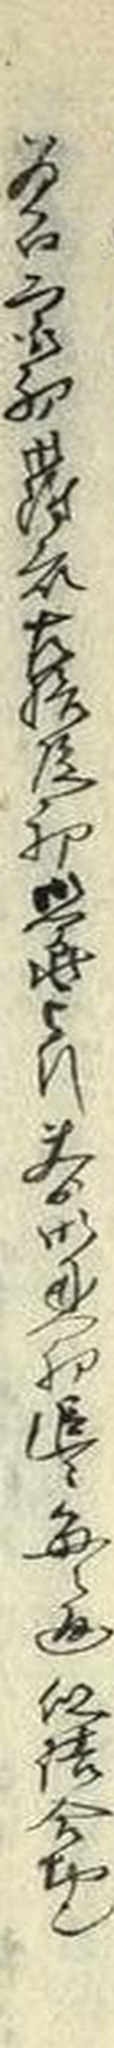為召最初御附衆左膳殿初御鬮被引夫ゟ御用人初追々毎之通但詰合切也
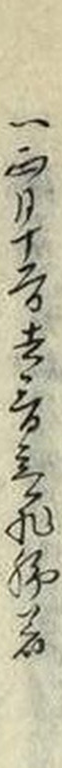一正月十二日去三日立飛脚着
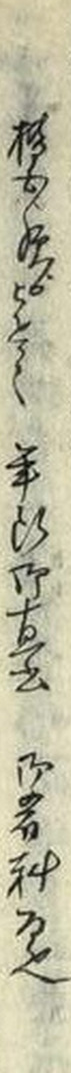楷五郎様ゟ被進之年頭御直書御肴料百疋

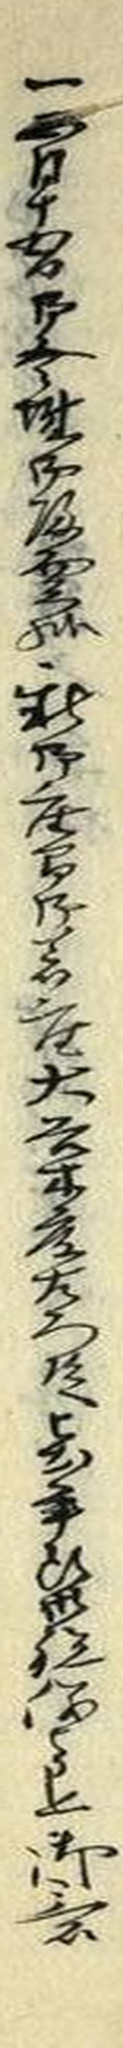一正月十五日御登城御帰殿掛新御座間御着座大谷木藤左衛殿被出年頭御祝儀被申上御意
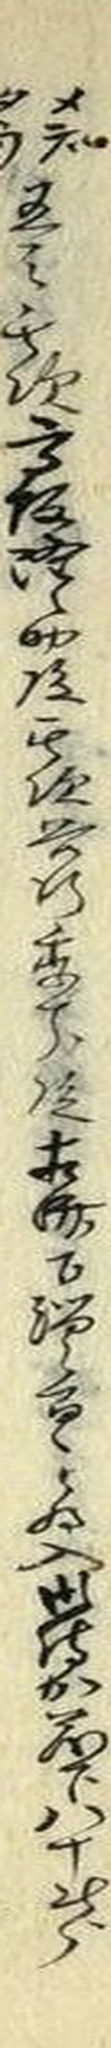タウ有之其次高坂隆之助殿其次谷行季一郎殿相済下溜之間へ被為入御侍加茂下八十次郎
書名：少傅日録抄（斉善付側向頭取日記、在府）
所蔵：福井県文書館 Fukui Prefectural Archives
